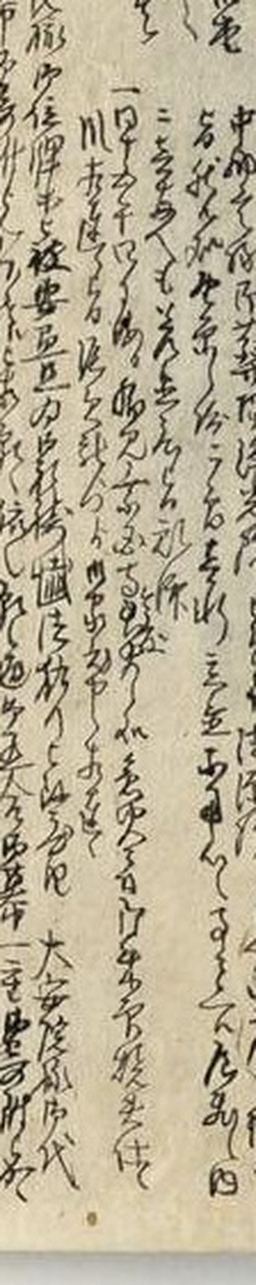一同十五午四月晦日勝見乗国寺今度失火之処急火に付御朱印焼失仕候
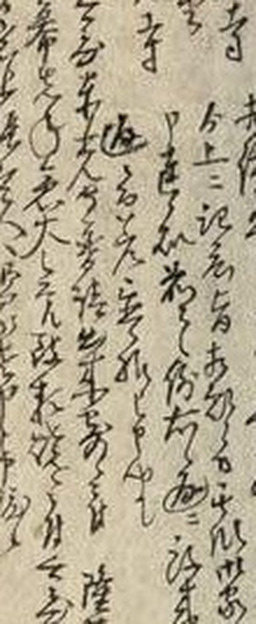通にて差置候様被申聞候
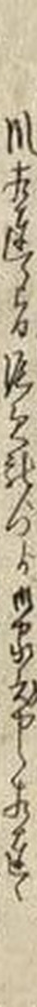段相達候旨渥美新右衛門ゟ御家老中へ相達候
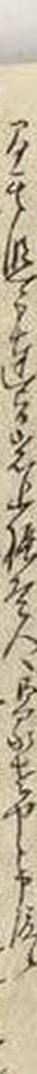間其段可申達旨岩上梶大夫へ御家老中被申渡候
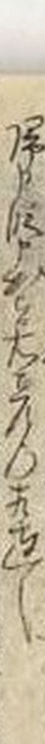帰申段申出旨右彦右衛門相達之
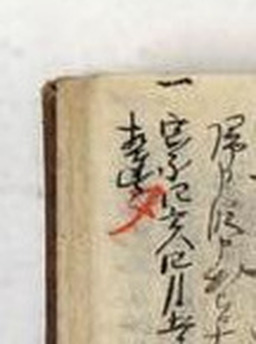相達候

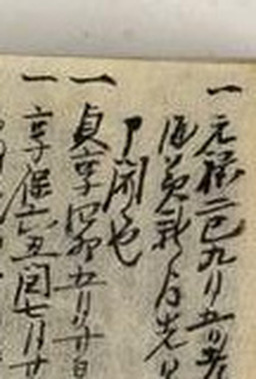申聞候也
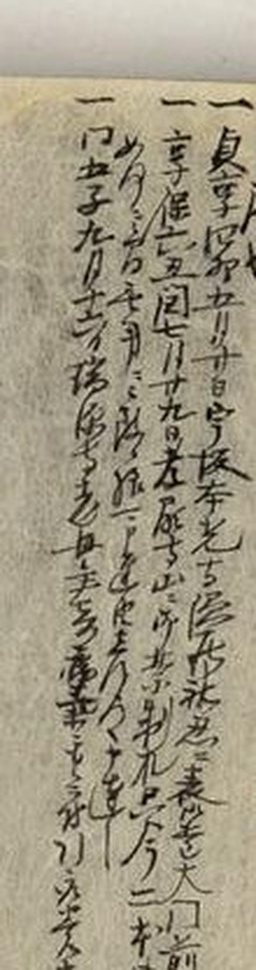如何に候間無用にて改候様可申達由彦右衛門へ申達之

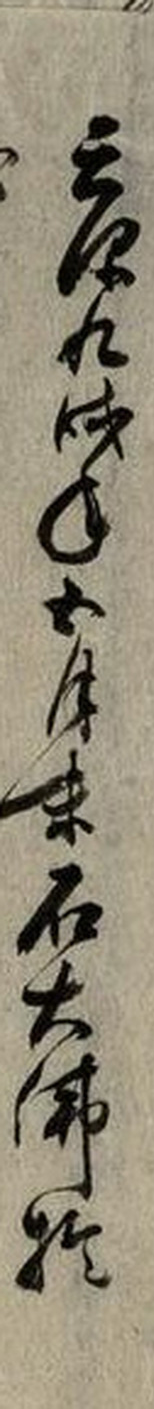天保九戌年五月末石大仏於
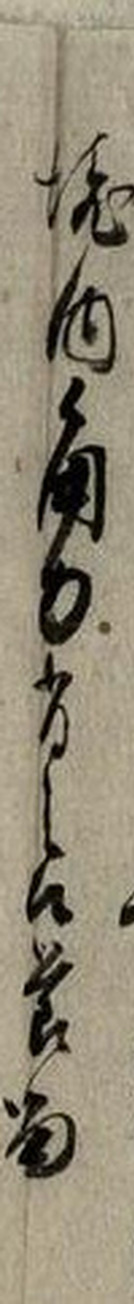境内角力有之候節留
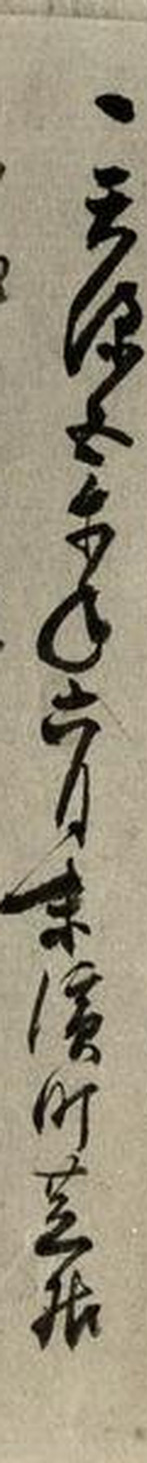一天保五午年六月末浜町芝居
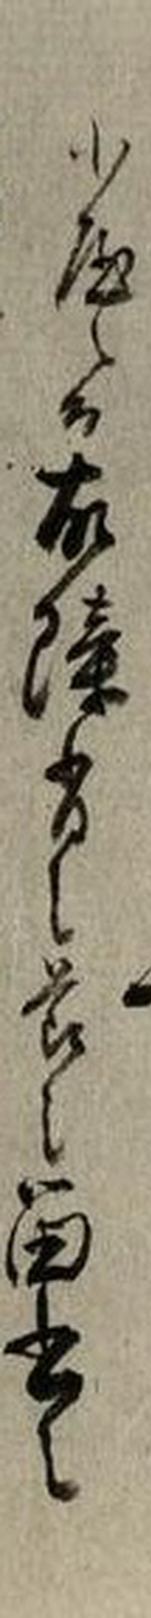小屋にて故障有之節之留書之
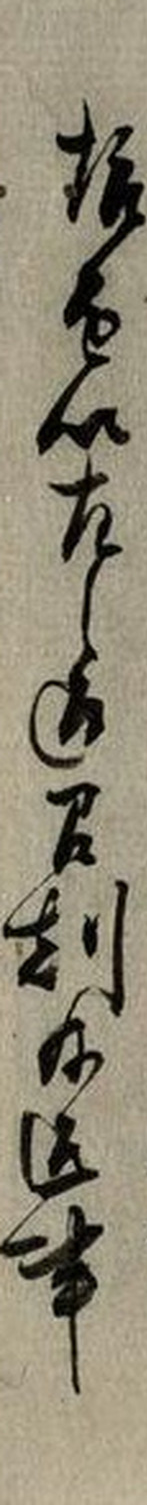趣を以左之通即刻及返事
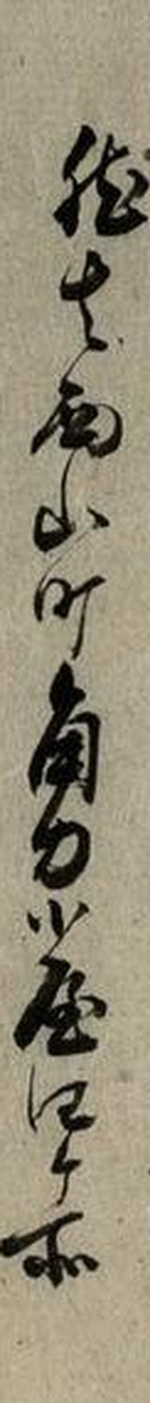然は西山町角力小屋四ケ所
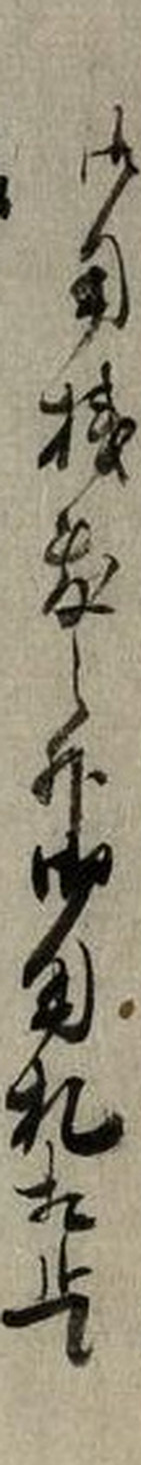御用桟敷之外御用札相止候
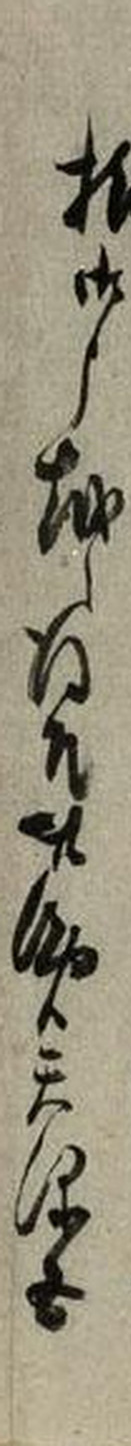様御申越候得共此儀は天保五
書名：御城下諸事之部
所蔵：福井県文書館 Fukui Prefectural Archives
